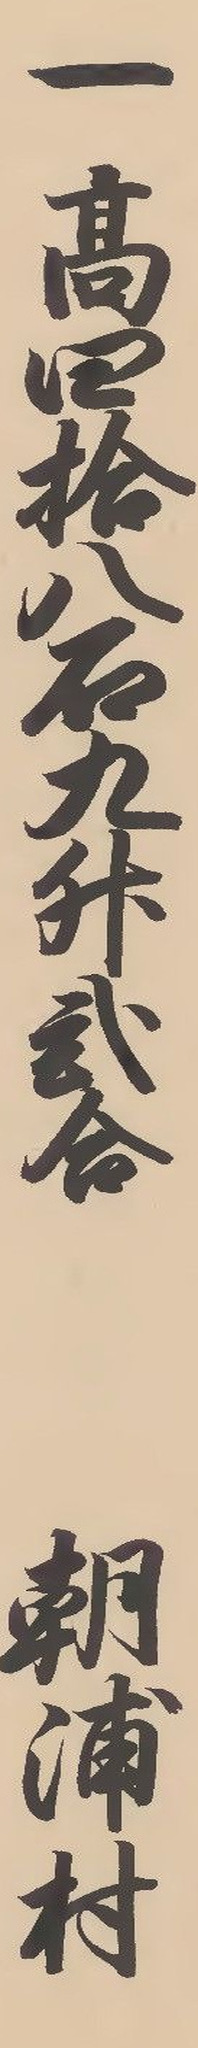一高四拾八石九升弐合朝浦村
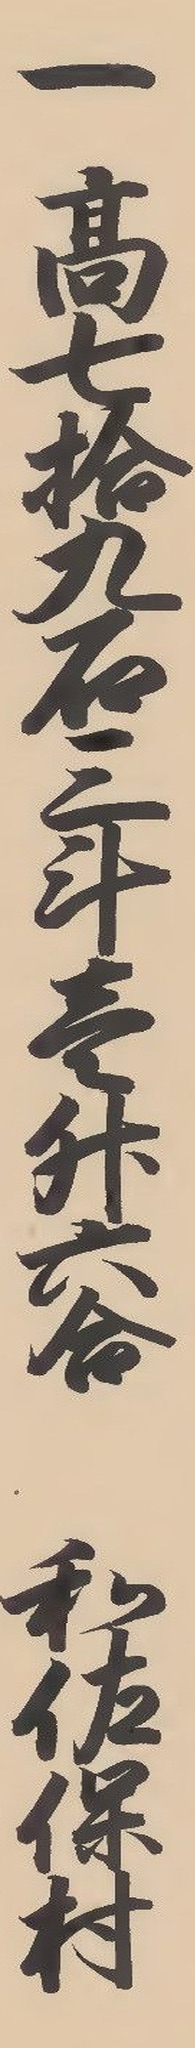一高七拾九石三斗壱升六合和佐保村
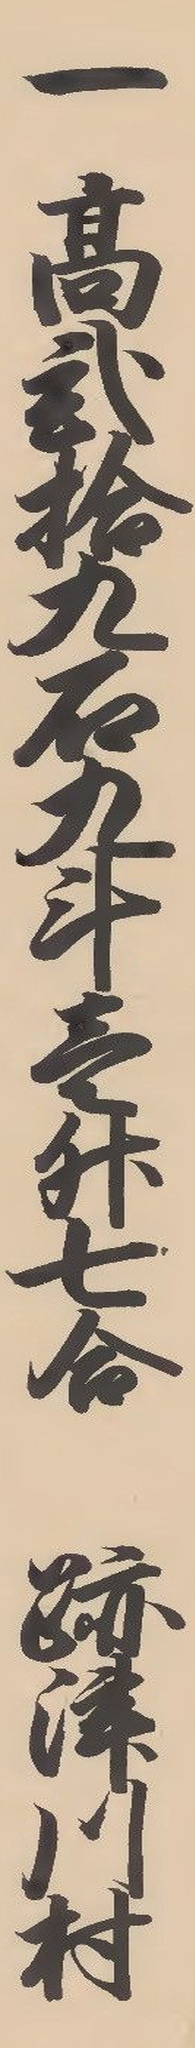一高弐拾九石九斗壱升七合跡津川村
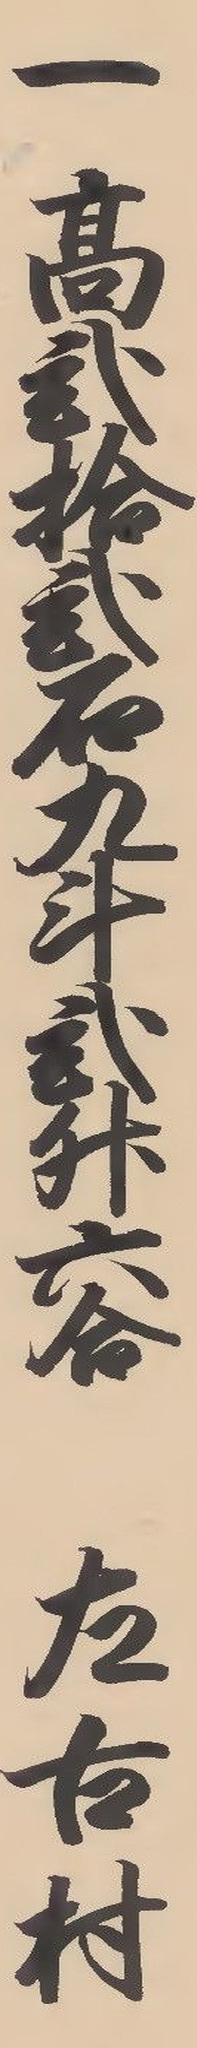一高弐拾弐石九斗弐升六合左古村
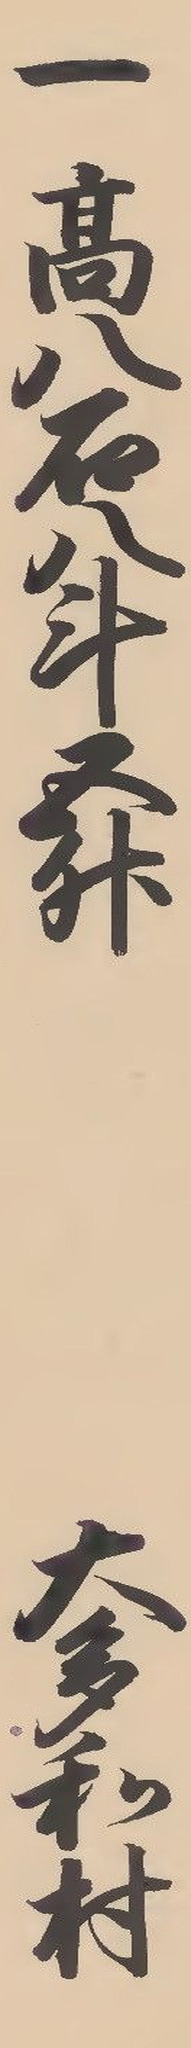一高八石八斗五升大多和村

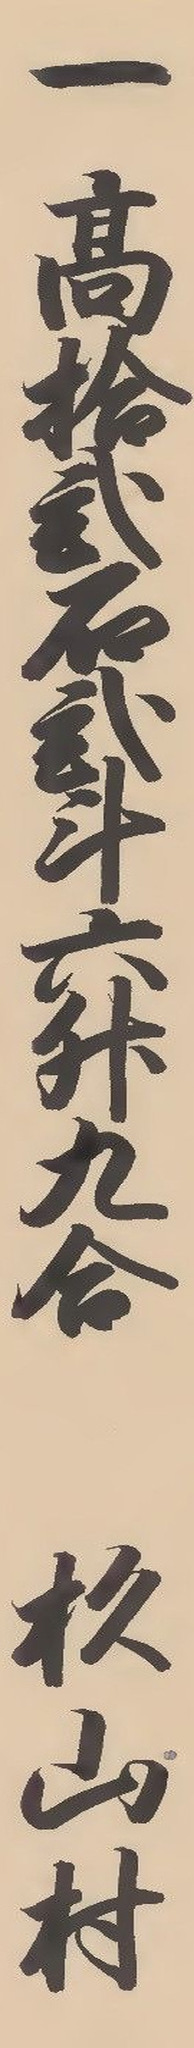一高拾弐石弐斗六升九合杉山村
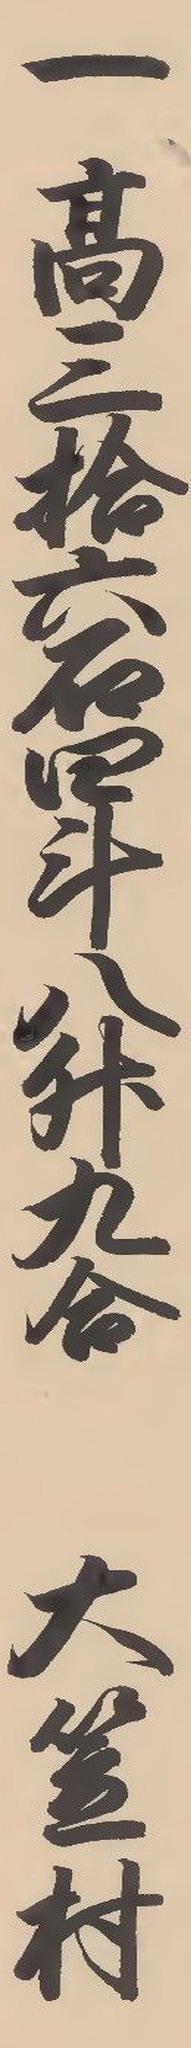一高三拾六石四斗八升九合大笠村
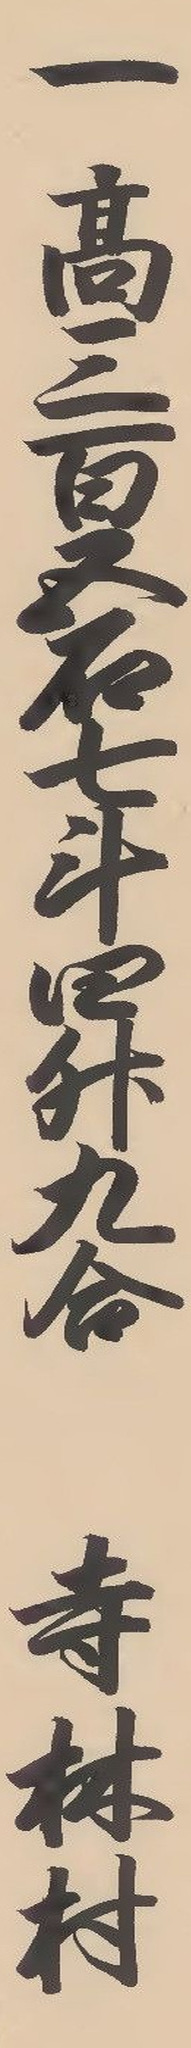一高三百五石七斗四升九合寺林村
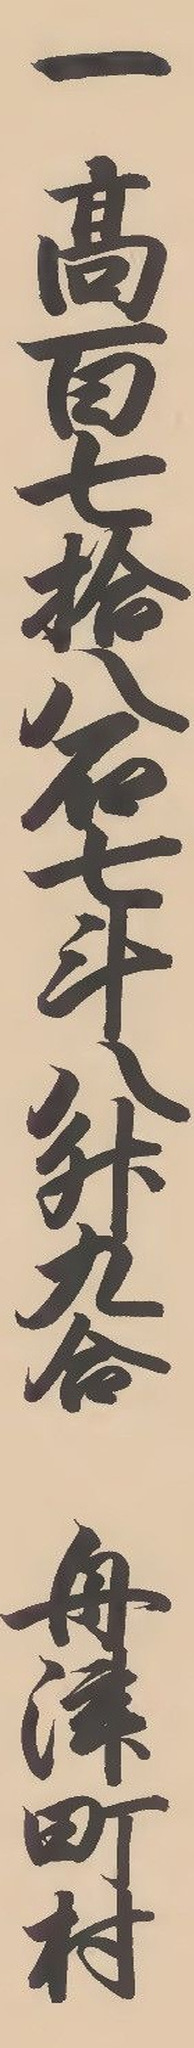一高百七拾八石七斗八升九合舟津町村
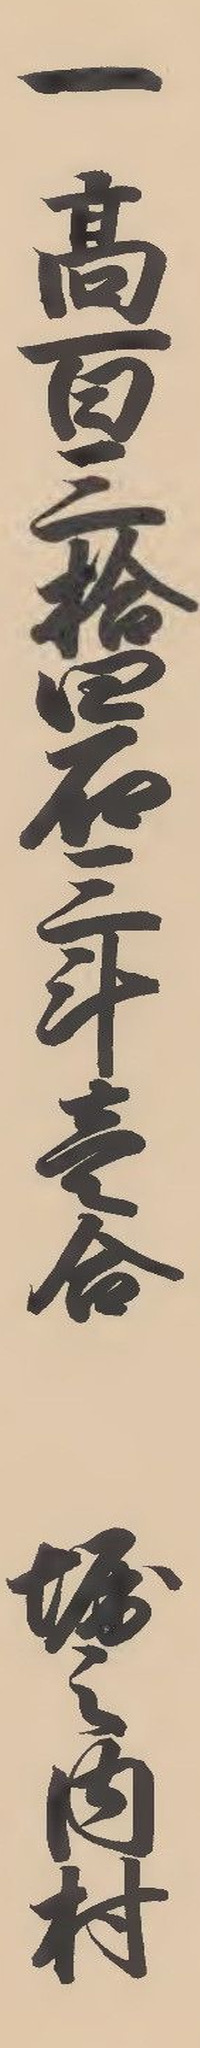一高百三拾四石三斗壱合堀之内村
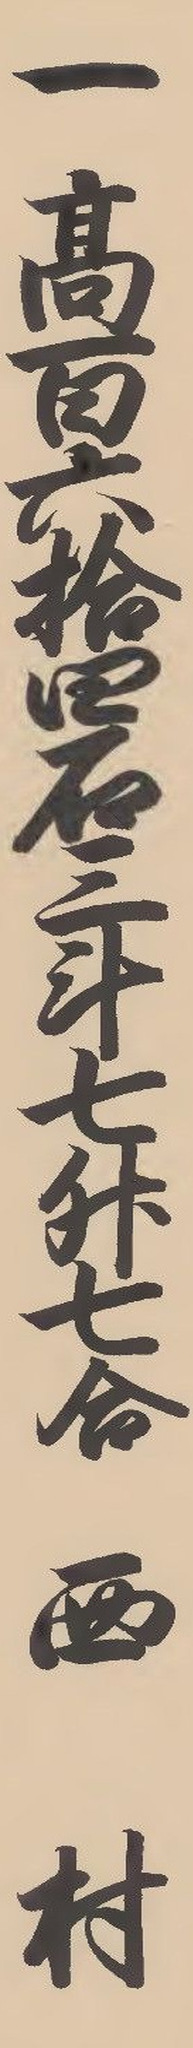一高百六拾四石三斗七升七合西村
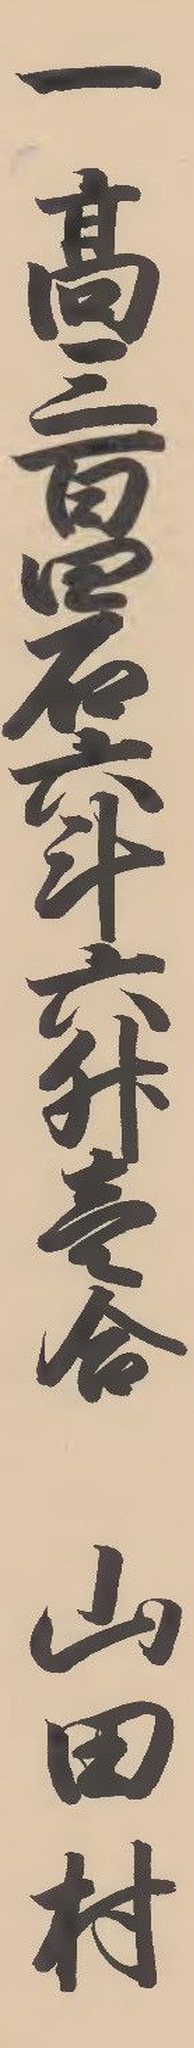一高三百四石六斗六升壱合山田村
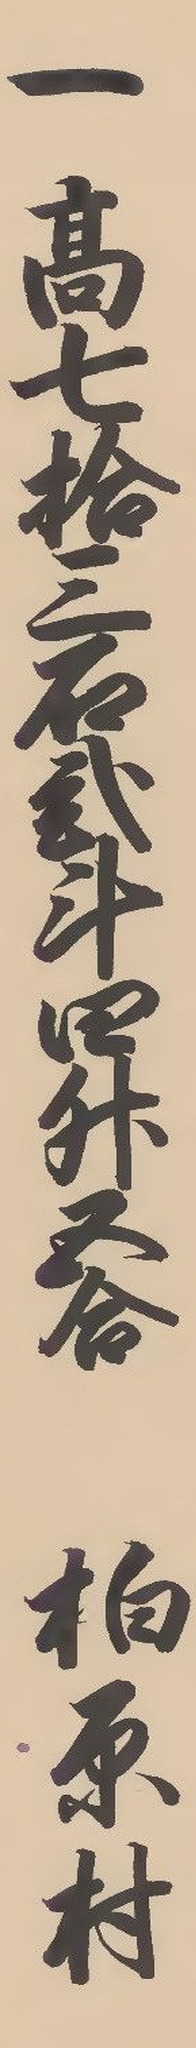一高七拾三石弐斗四升五合柏原村

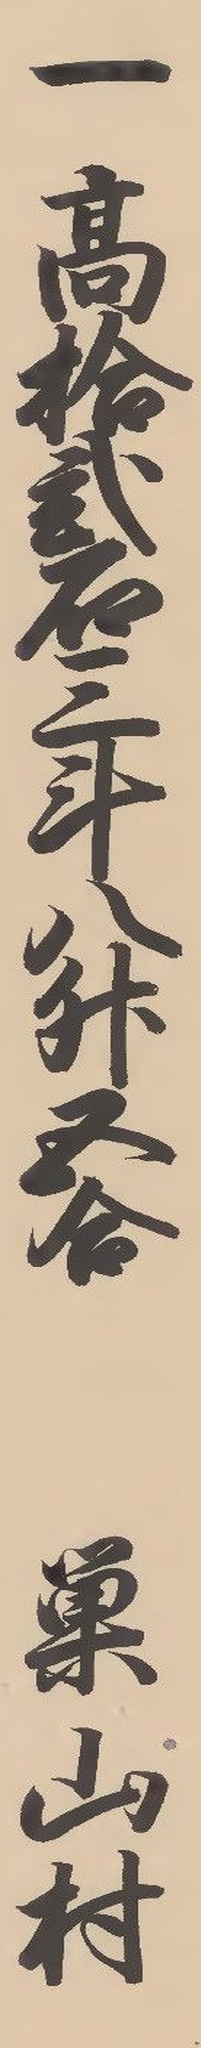一高拾弐石三斗八升五合巣山村
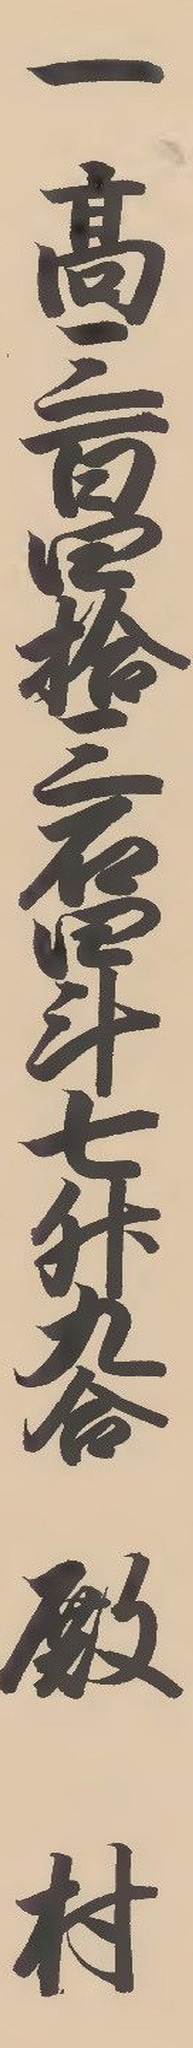一高三百四拾三石四斗七升九合殿村
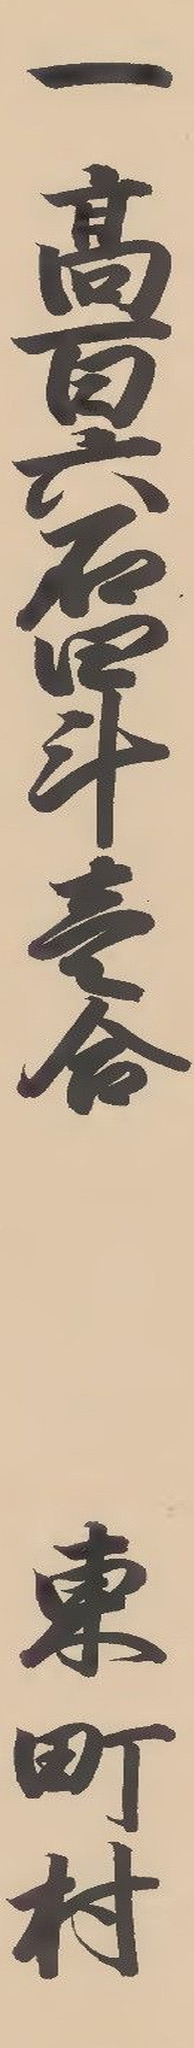一高百六石四斗壱合東町村
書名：飛騨国郷帳
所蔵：国立公文書館 National Archives of Japan
